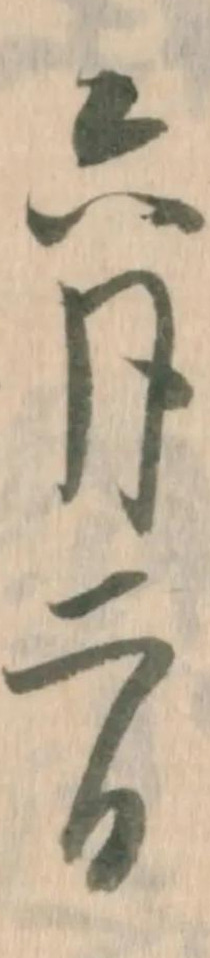六月二日
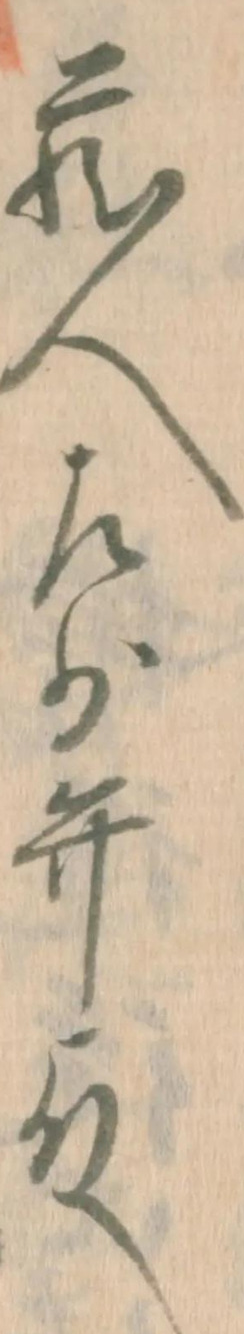蔵人左少弁殿
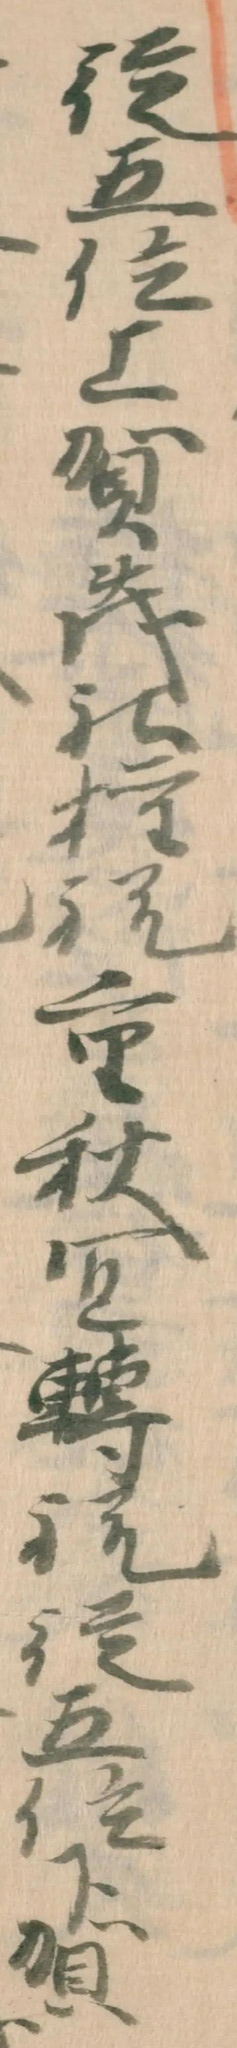従五位上賀茂社権祝重秋宜転祝従五位下賀茂
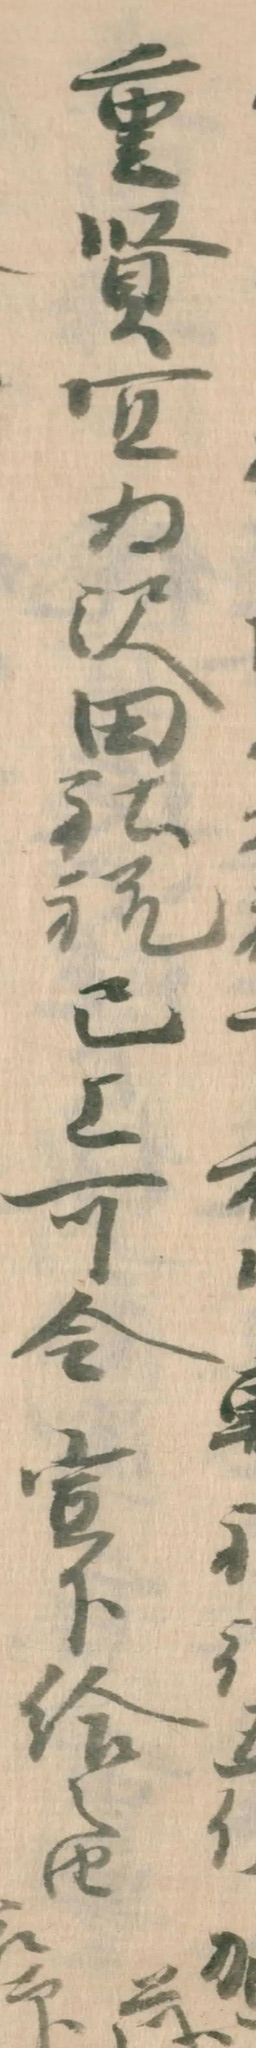重賢宜為沢田社祝已上可令宣下給之由被仰
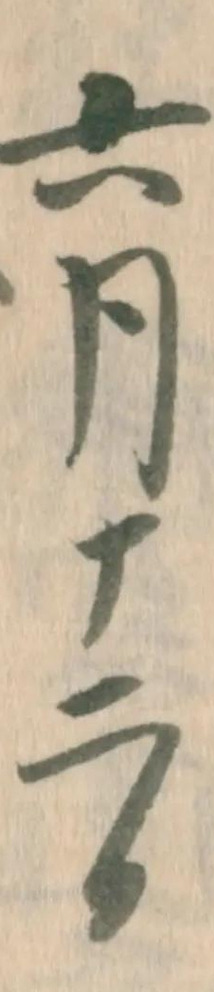六月十二日
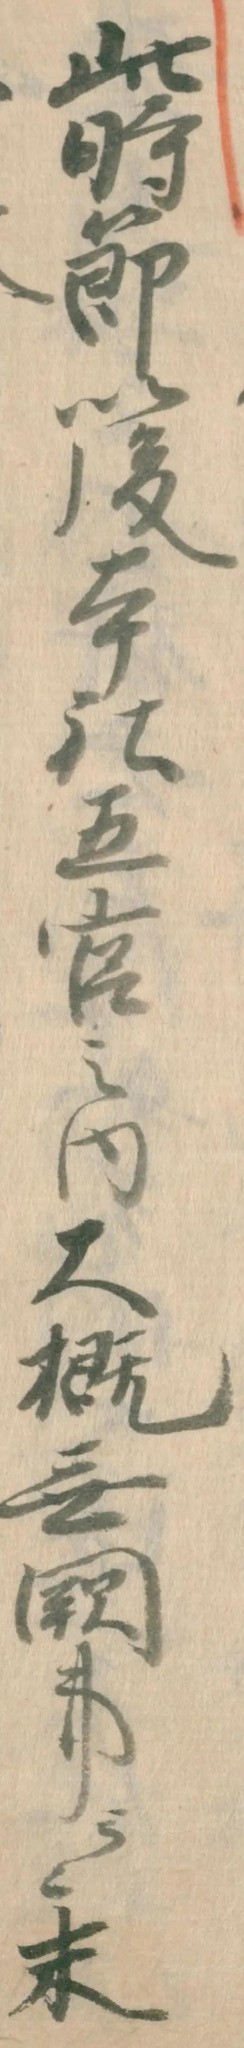此時節以後本社五官之内大概無闕事云々末
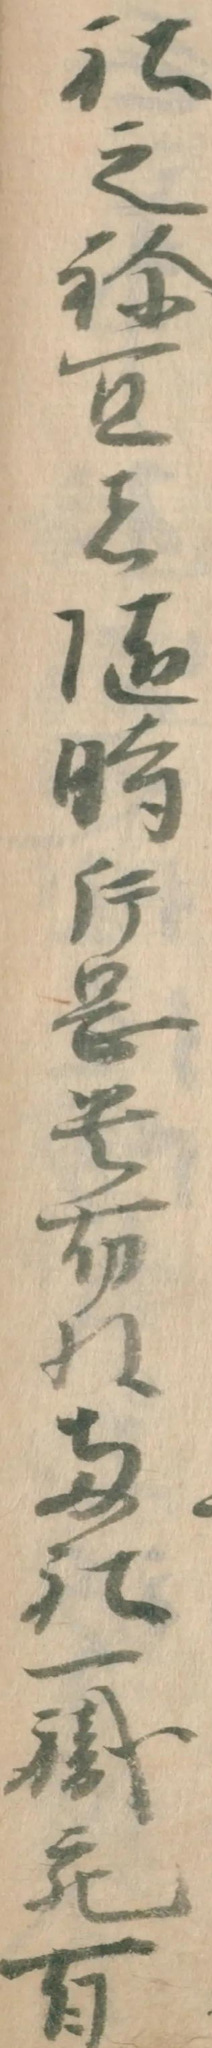社之祢宜は随時片岡貴ふね両社一職宛有

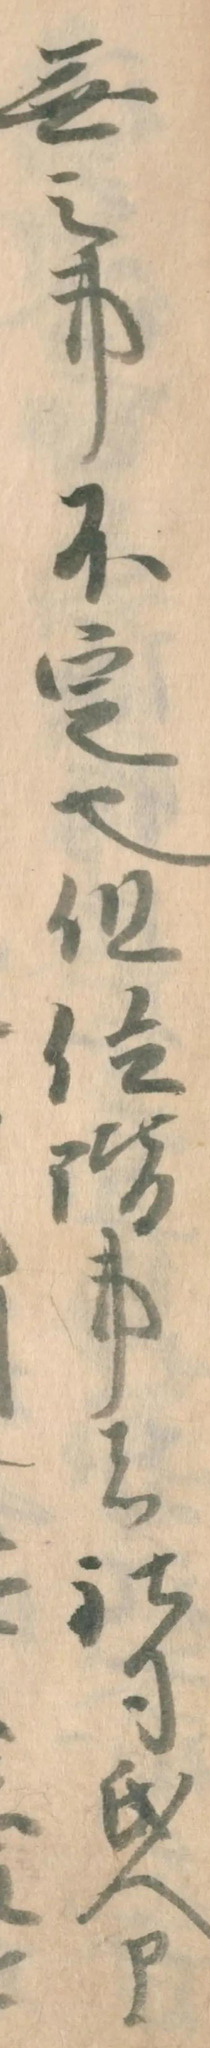無之事不定也但位階事は社司氏人申
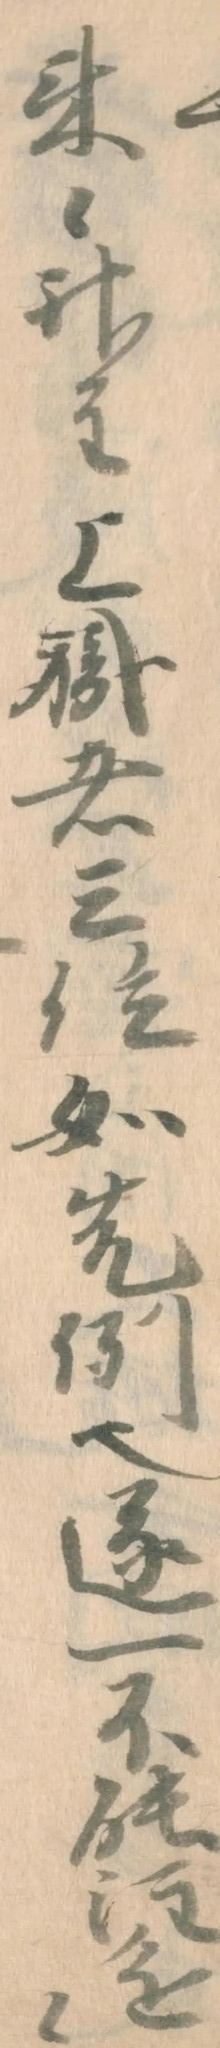来候神主上職は三位如先例也逐一不能注進候
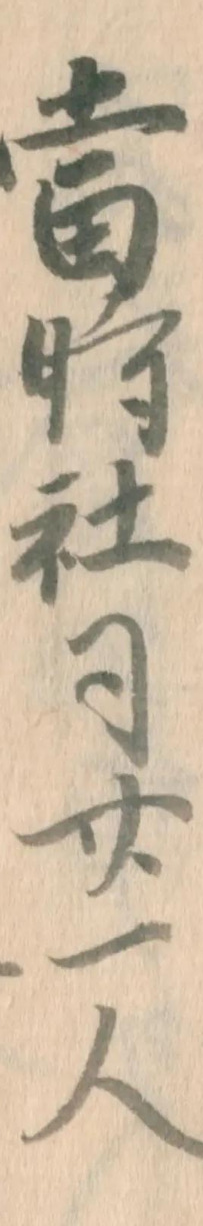当時社司廿一人
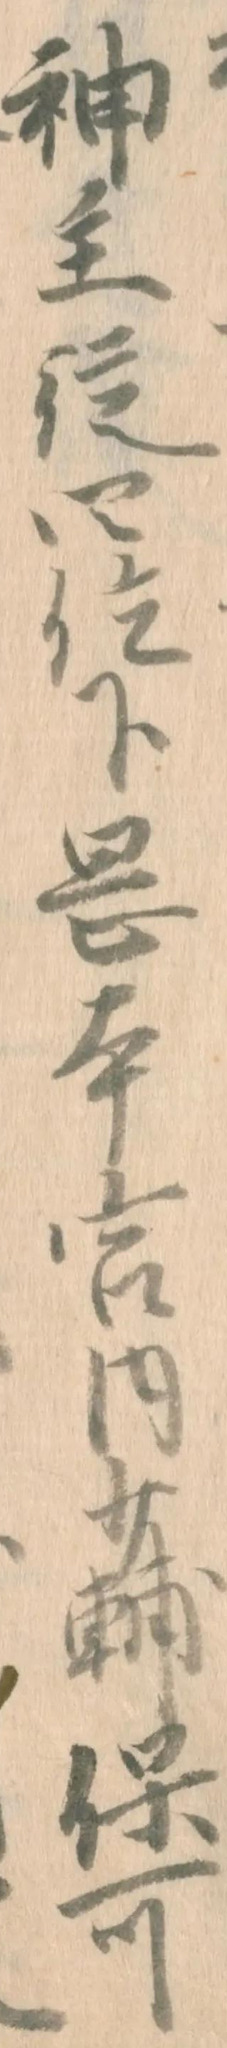本社神主従四位下岡本宮内少輔保可
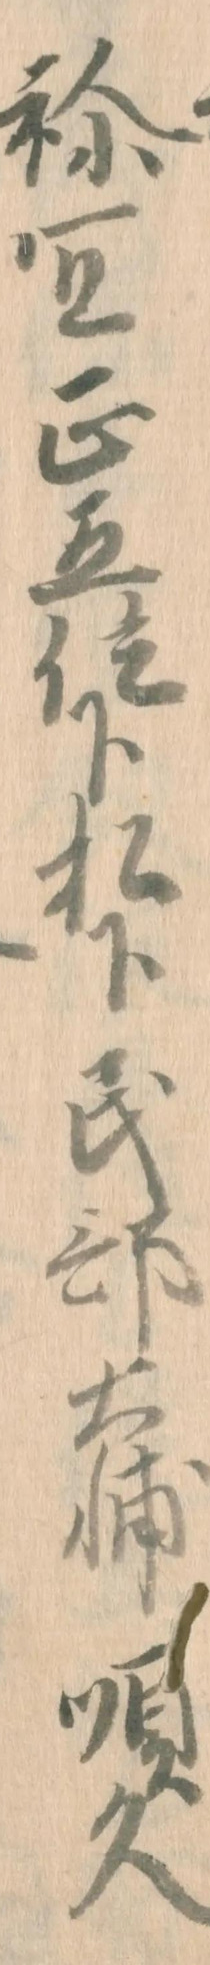称宜正五位下松下民部大輔順久
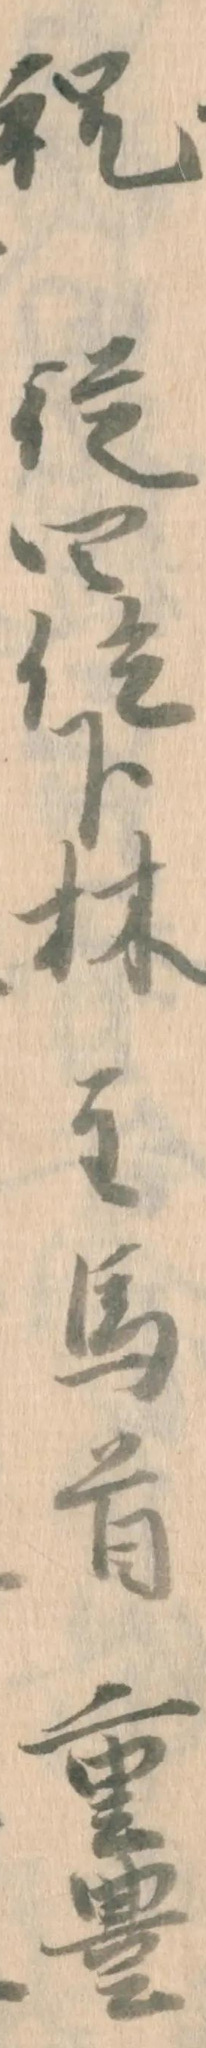祝従四位下林主馬首重豊
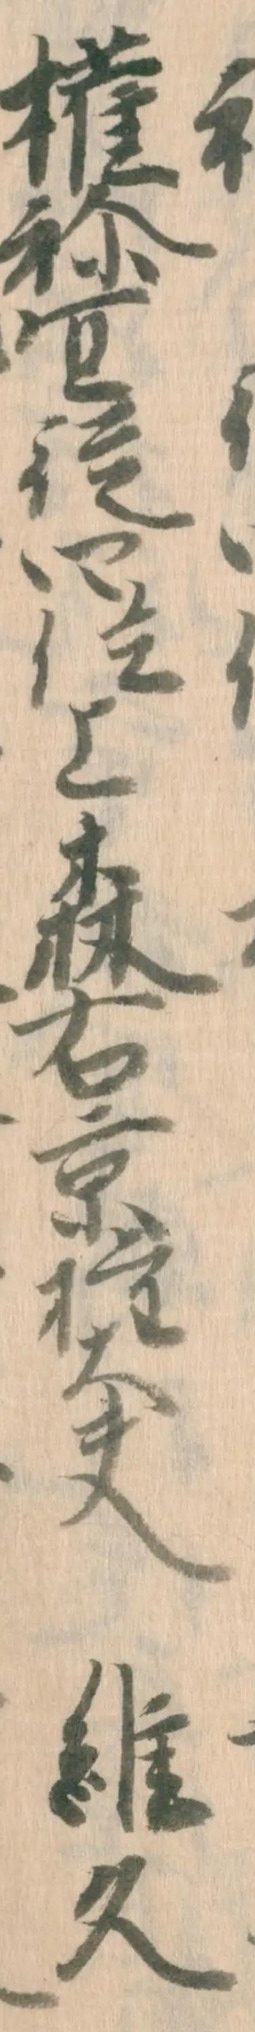權祢宜従四位上森右京権大夫維久
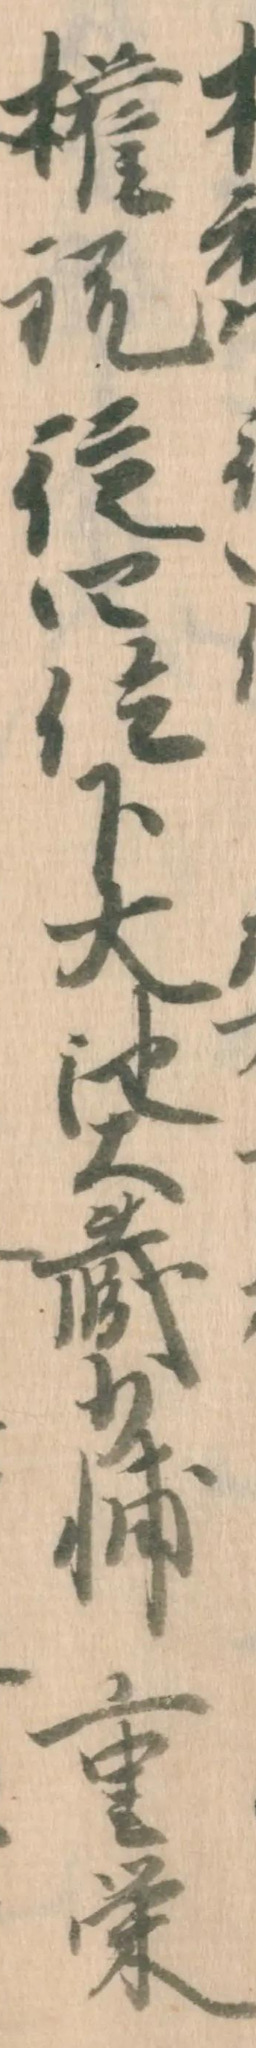權祝従四位下大池大蔵少輔重栄
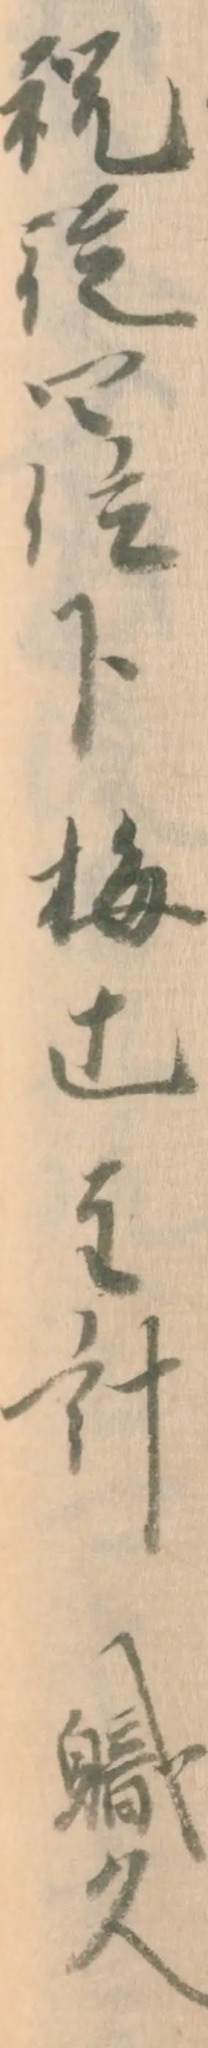祝従四位下梅辻主計職久
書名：賀茂社記録. 第1冊
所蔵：国立国会図書館 National Diet Library, JAPAN
